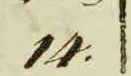14.
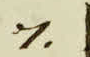7.
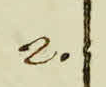2.
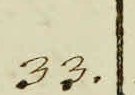33.
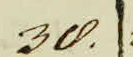38.
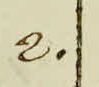2.
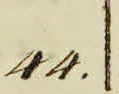44.
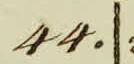44.
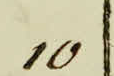10
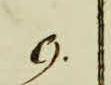9.
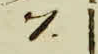7.
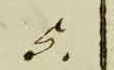5.
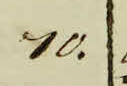70.
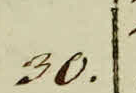30.
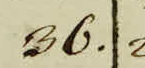36.
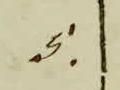5.
